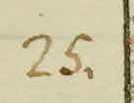25.
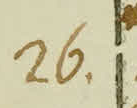26.
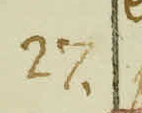27.
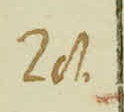28.
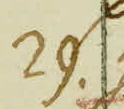29.
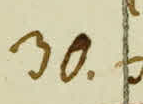30.
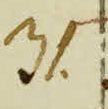31.
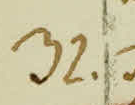32.
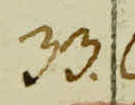33.
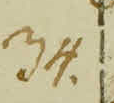34.
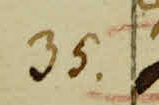35.
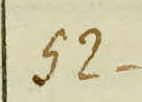52
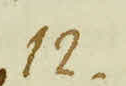12
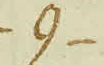9
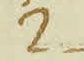2
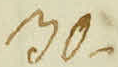30
